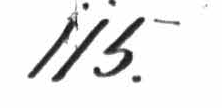115.
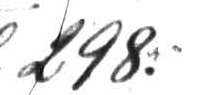298.
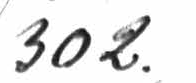302.
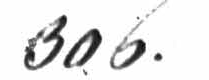306.
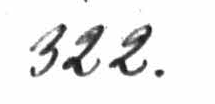322.
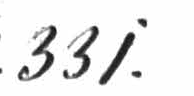331.
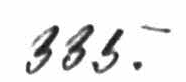335.
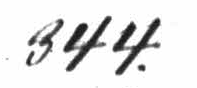344.
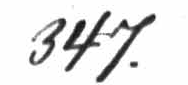347.
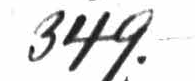349.
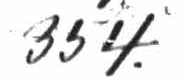354.
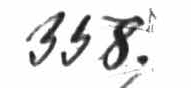358.
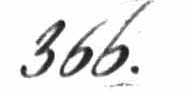366.
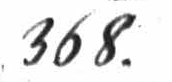368.
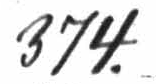374.
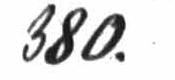380.
